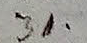31
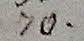70
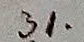31
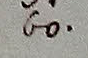60
